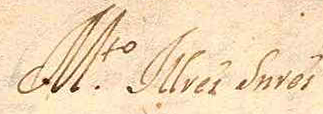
M.to Illres̄ Snres̄
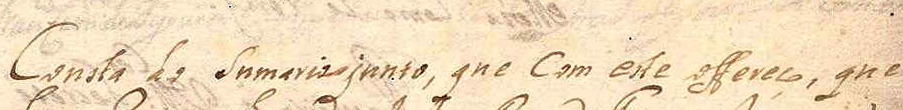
Consta do Sumario junto, que Com este offereço, que
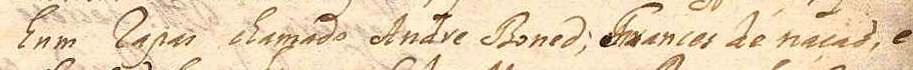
hum Rapas chamado Andre Boned; Frances de naçaõ, e
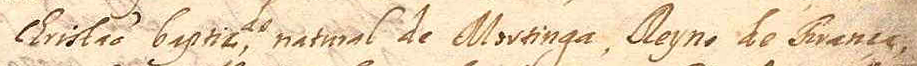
christaõ baptiz,do natural de Mortinga, Reyno de França,
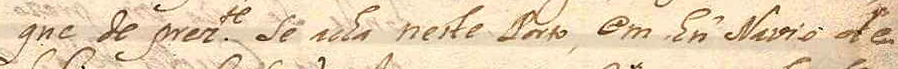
que de prez.te se acha neste Porto, Em hū Navio de
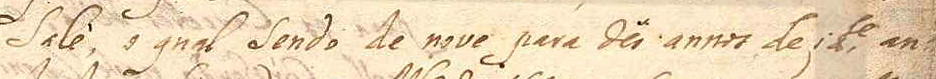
Salè, o qual sendo de nove para dés annos de id̄.e an
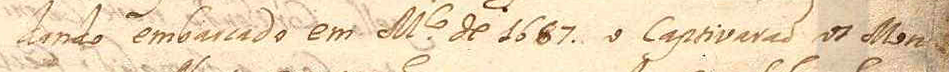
dando embarcado em M.Co de 1687. o Captivaraõ os Mou
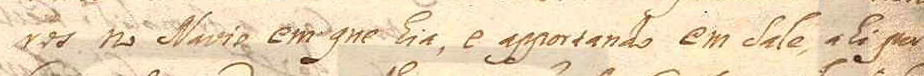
ros no Navio em que hia, e apportando em Sale, ahi per
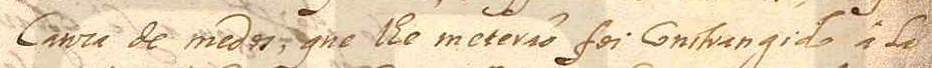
Cauza de medos, que lhe meteraõ foi Constrangido á La
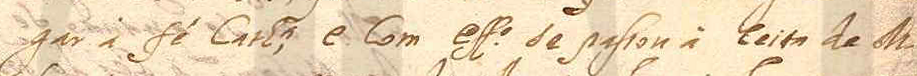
gar a fé Cath,a e Com Eff.o se passou à Ceita de M
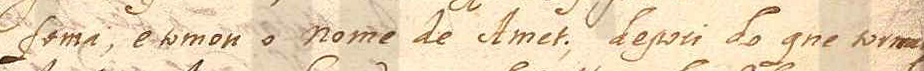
foma; e tomou o nome de Amet; depois do que torna
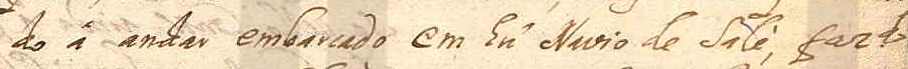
do á andar embarcado em hū Navio de Salé, faz.do
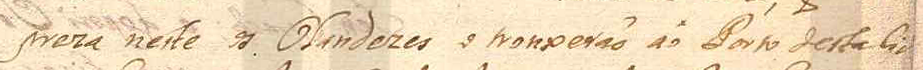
preza neste os Olandezes o trouxeraõ aó Porto desta Ci
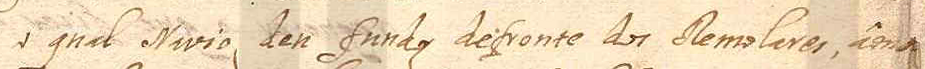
o qual Navio deu fundo defronte dos Remolares, aôn
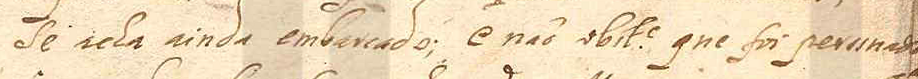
Se acha ainda embarcado; e naõ obst.e que foi perssuad
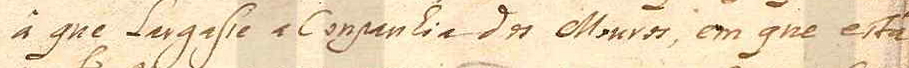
a que Largasse a Conpanhia dos Mouros, em que está
